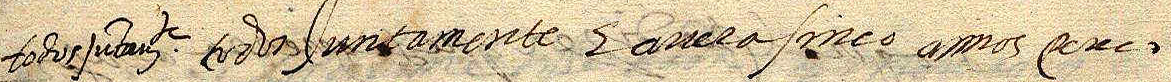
todos Juntamente E auera sinco annos pouco
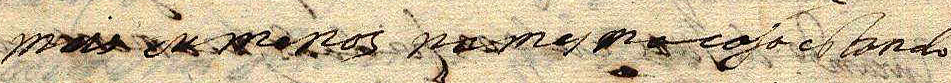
mais ou menos na mesma casa estando
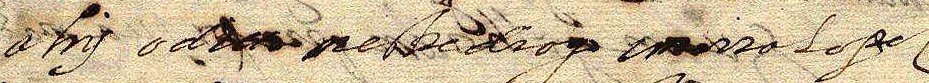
ahy o ditto mestre diogo e maria Lopez
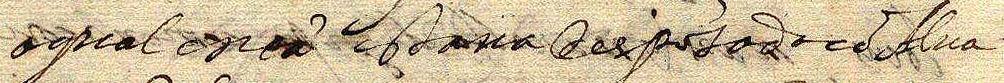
a qual entaõ estaua desposada cō Alua
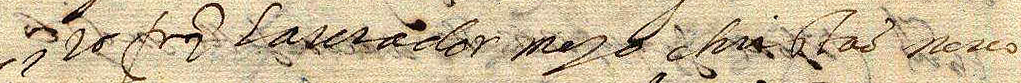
ro frz̄ laurador mejo christaõ nouo
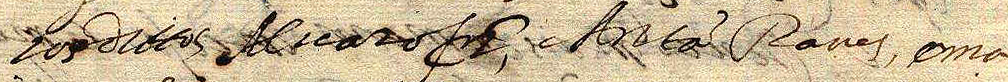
e os dittos Aluaro frz̄, e Antaõ Raues, e ma
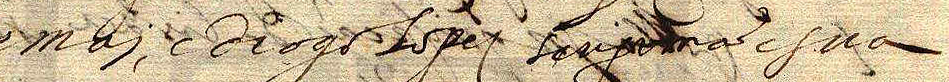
e maj, e diogo Lopez seu jrmaõ e sua
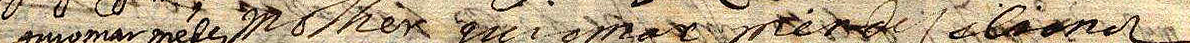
molher guiomar mendez e lianor
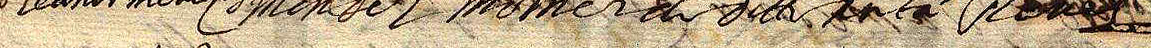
mendez molher do ditto antā Reues
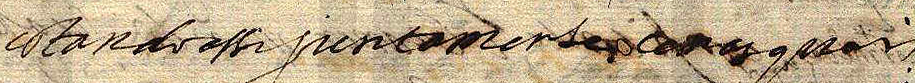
estando assi juntamente com as quais
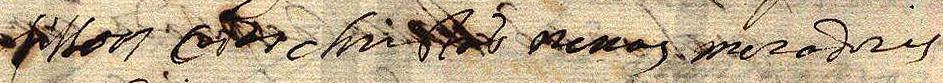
pissoas todas christas̄ nouas moradores
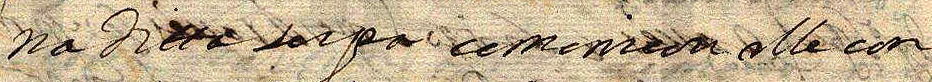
na ditta serpa comonicou elle con
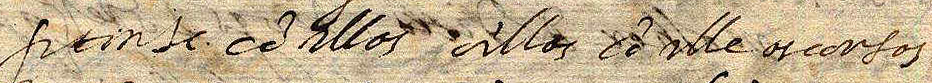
fitente cō ellas e ellas cō elle as cousas
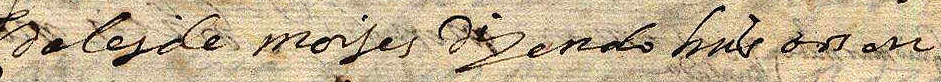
da lej de moises dizendo hūs aos ou
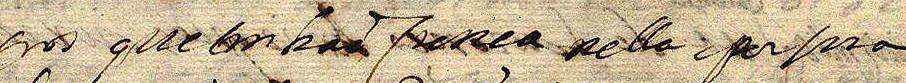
tros que tinhaõ Crença nella e por sua
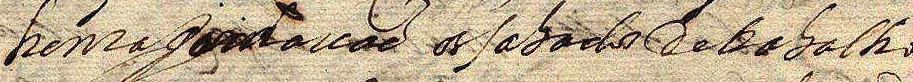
honra guardauaõ os sabados de trabalho
